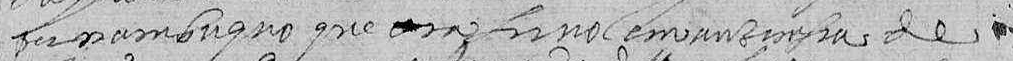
pernambuquo que ora siruo em auzemsia de
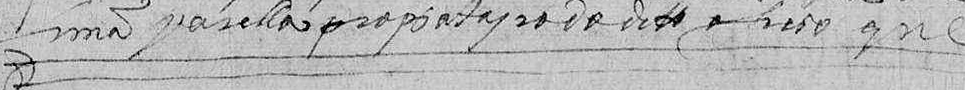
Simã Varella propiatajro do ditto oficio que
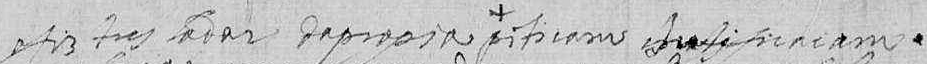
o fiz tresladar da propia pitiçam, Justificaçam
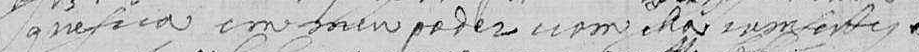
que fica em meu poder e com ella comtestej a
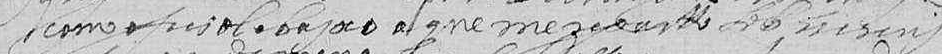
com o oficial abajxo a que me reportto sobEscreuj
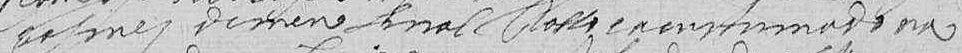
E asinej de meu sinal Rasso e acustumado na
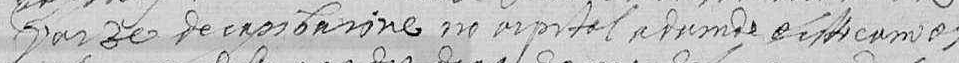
Varze de capibariue no ospital adomde ditto com os
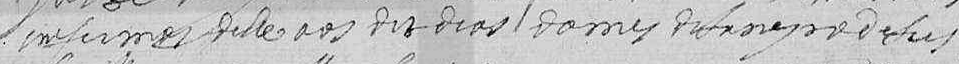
emfermos delle aos dez dias do mes de Ianejro de seis
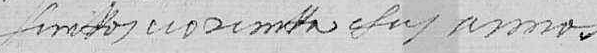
senttos e coremta e seis annos
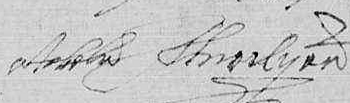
o tabeliã Manoel yoã
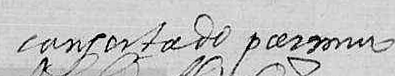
consertado por meu
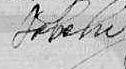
tabeliã
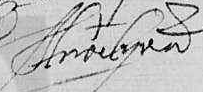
Manoel yoã
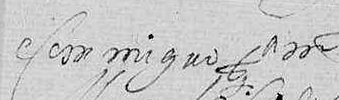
e Commiguo tam
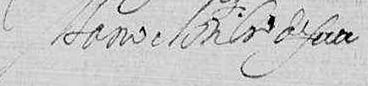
Manoel Ribro de Saa
